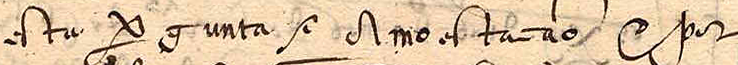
esta ꝑgunta e Amoestação e por
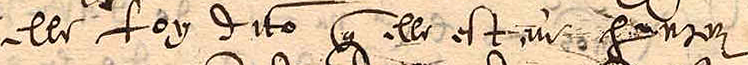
elle foy ditō q̄ elle esteue hontem
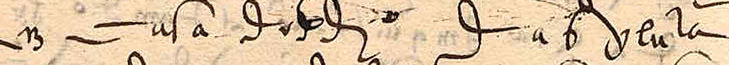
em casa de d̄o djo da sylura
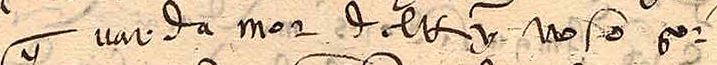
guarda mor del Rey noso sor̄
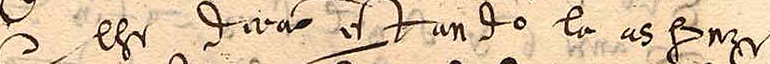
e lhe derão estando la as honze
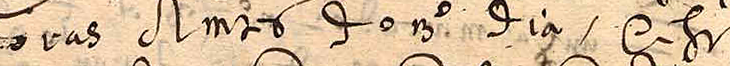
oras Amtes do mo dia / e che
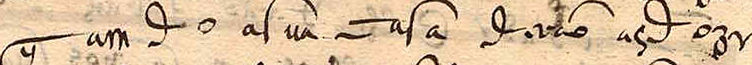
gamdo a sua Casa deraõ as doze
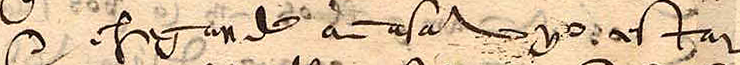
e chegando a Casa Vyo estar
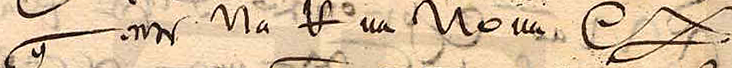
gente Na Rua Noua e ꝑ
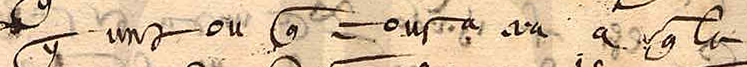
guntou q̄ cousa era aq̄la
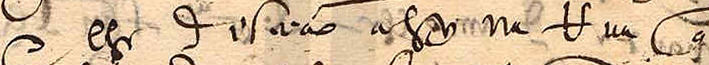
e lhe deseraõ ahy na Rua q̄
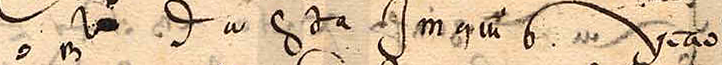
o mro da Sta Jmquisycaõ
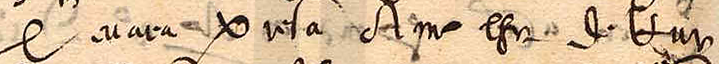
leuara presa A molher de Ruy
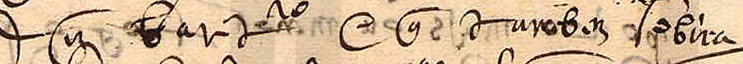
dīz baretro e q̄ tambem sobira
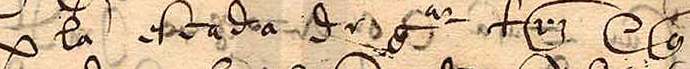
plā escada de gar fr̄z e q̄
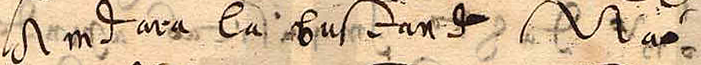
Amdara la buscando Naõ
